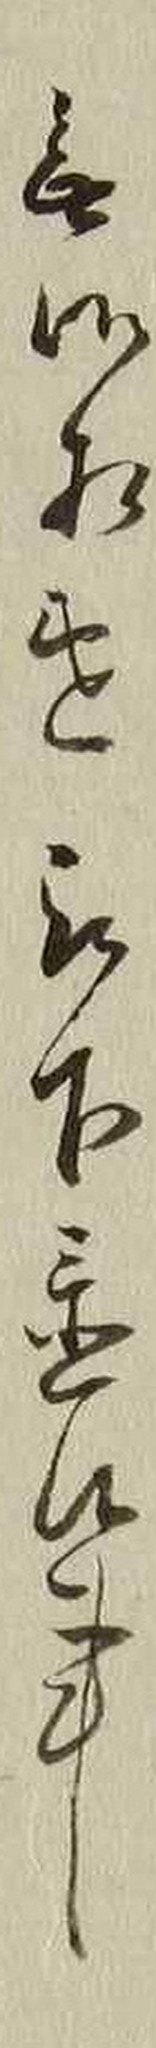無御相違被下置候事
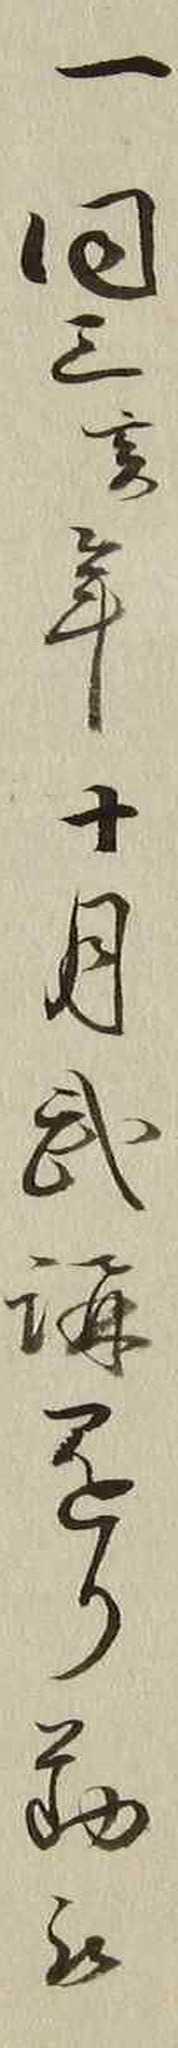一同三亥年十月武講懸り勤被
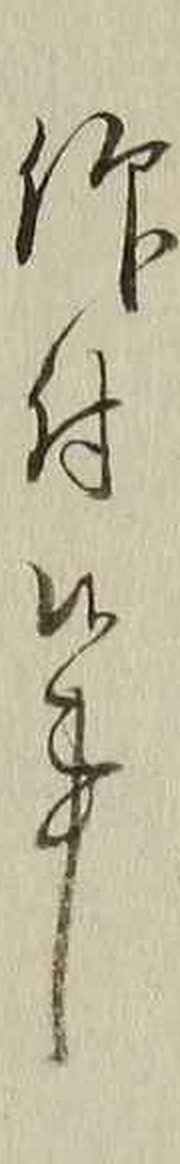仰付候事
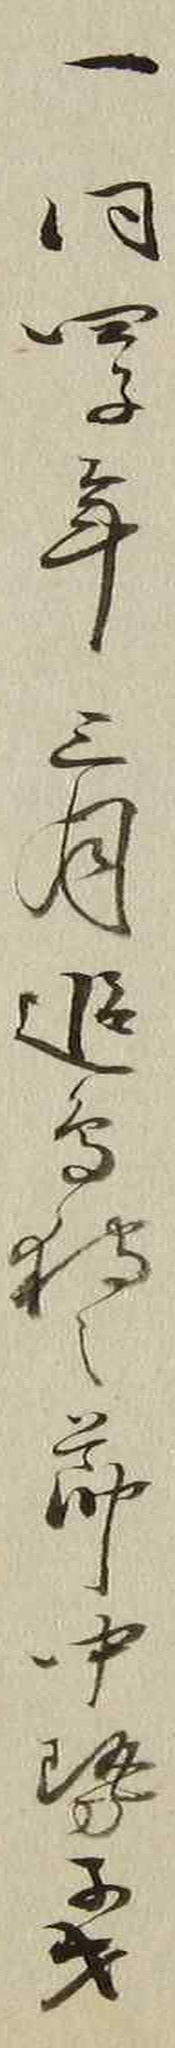一同四子年三月追鳥狩之節中勢子才
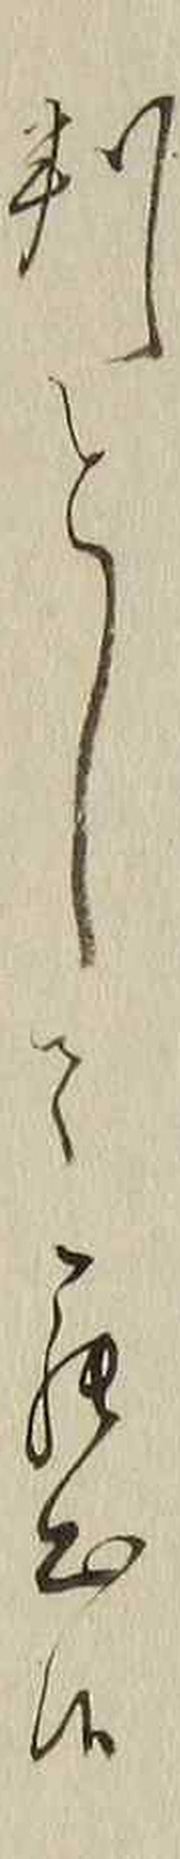判として罷出候
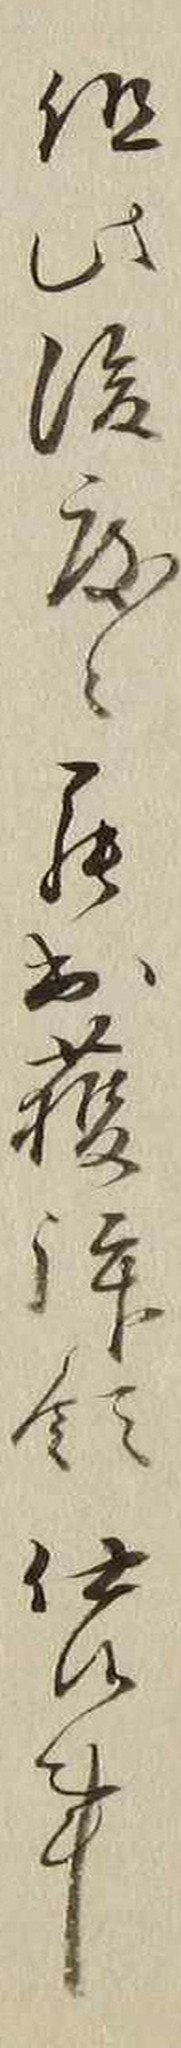但此後度々罷出獲拝領仕候事
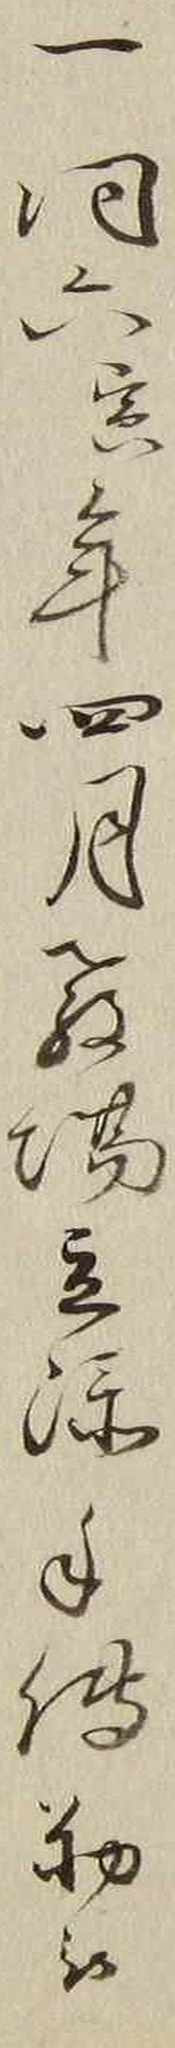一同六寅年四月教場立添手伝勤被
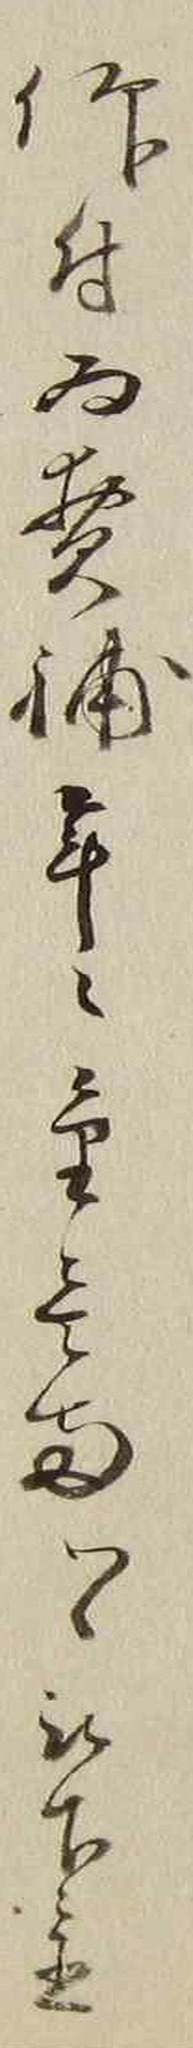仰付為費補年ニ金壱両ツヽ被下置
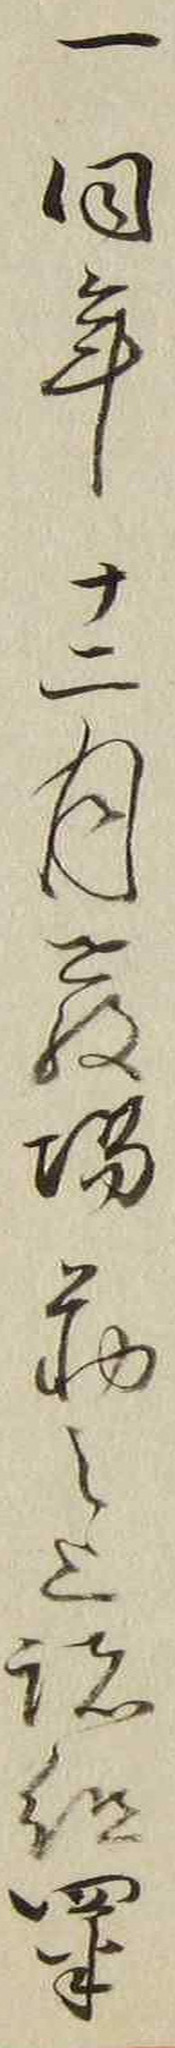一同年十二月教場勤之上跡組四半
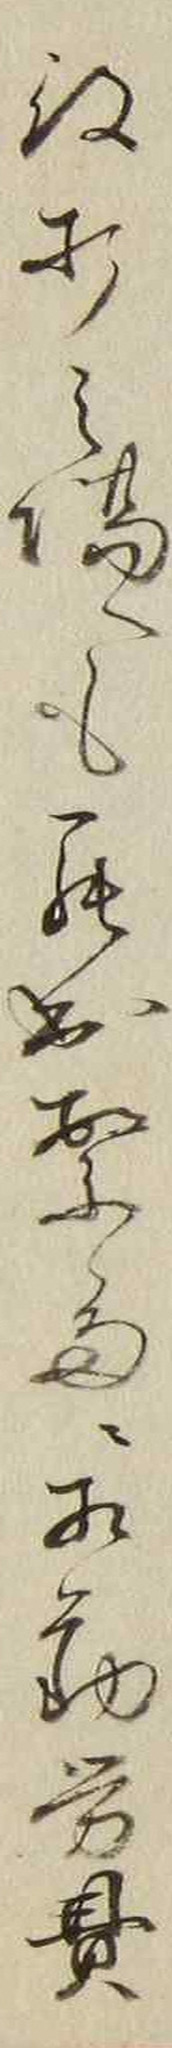役打之場へも罷出繁多ニ相勤労費

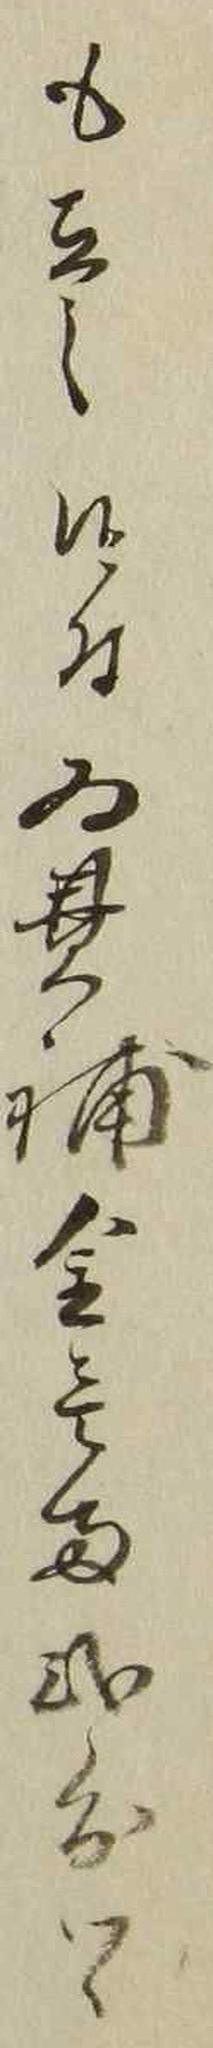も在之候ニ付為費補金壱両弐分ツヽ
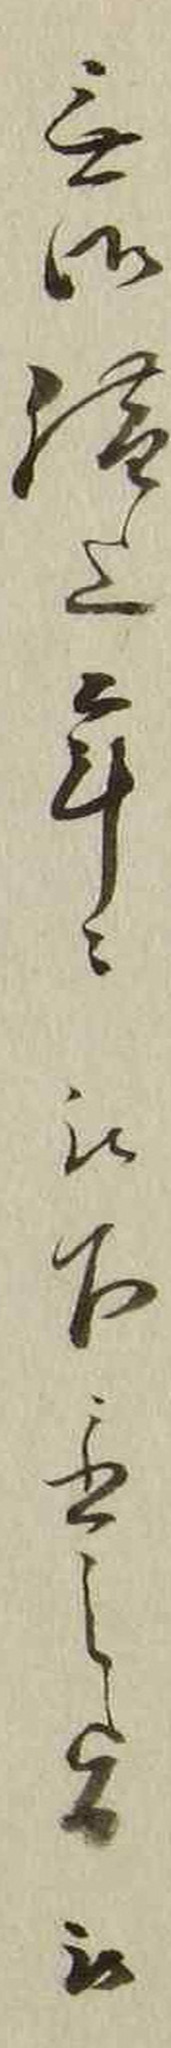無御借上年ニ被下置之旨被
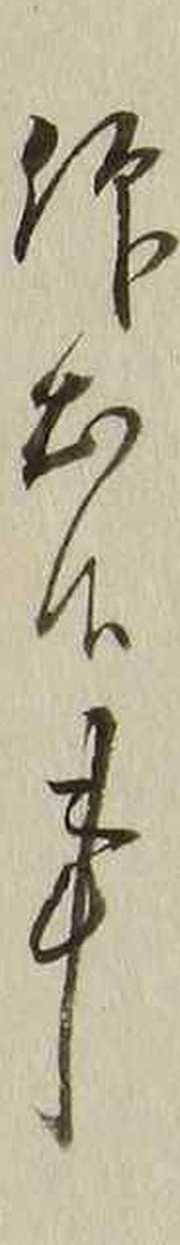仰出候事
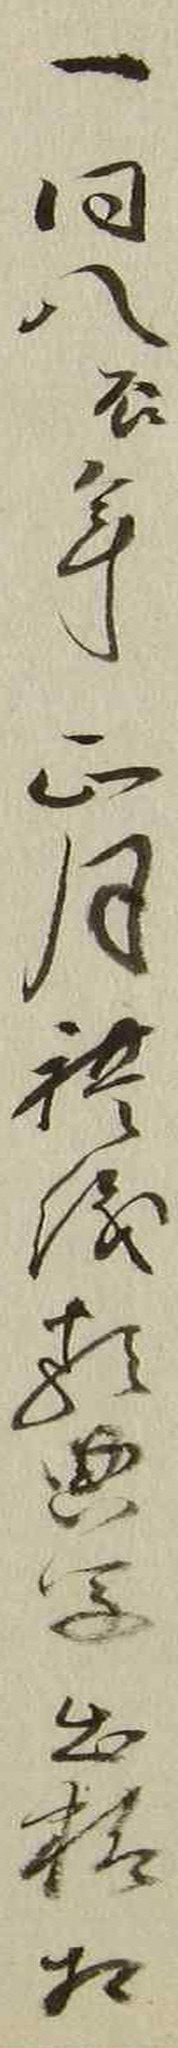一同八辰年正月礼儀類典写出精相
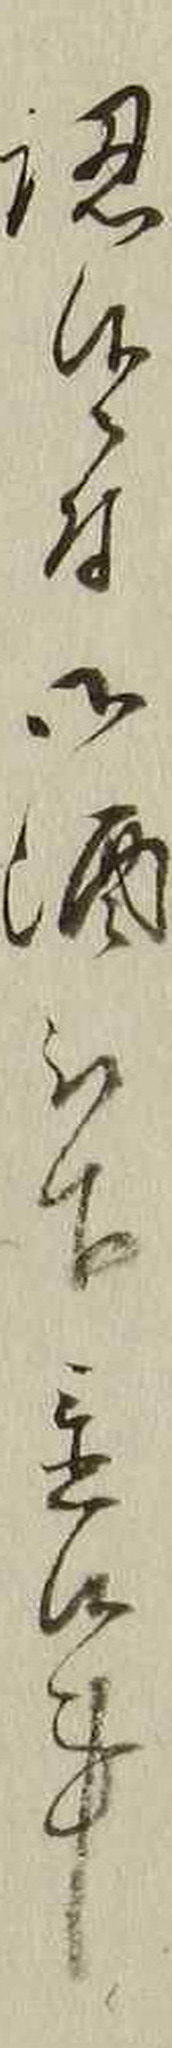認候ニ付御酒被下置候事
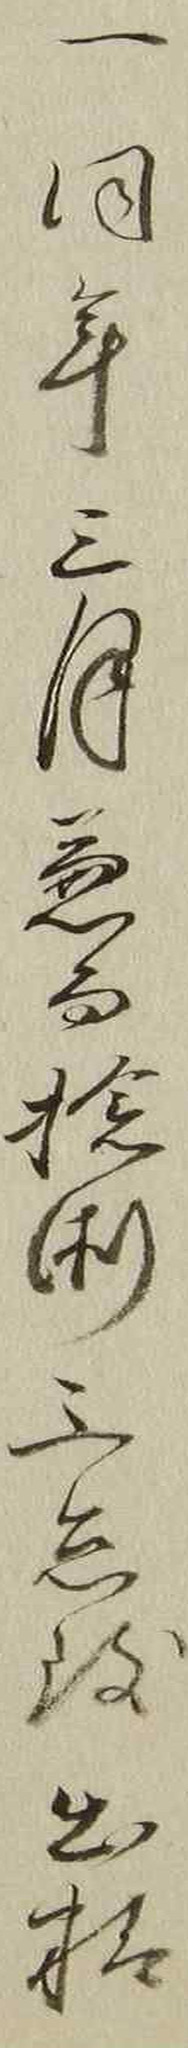一同年三月兼而剣術不怠致出精
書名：諸士系譜　巻之52　に之部3
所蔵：会津若松市立会津図書館
